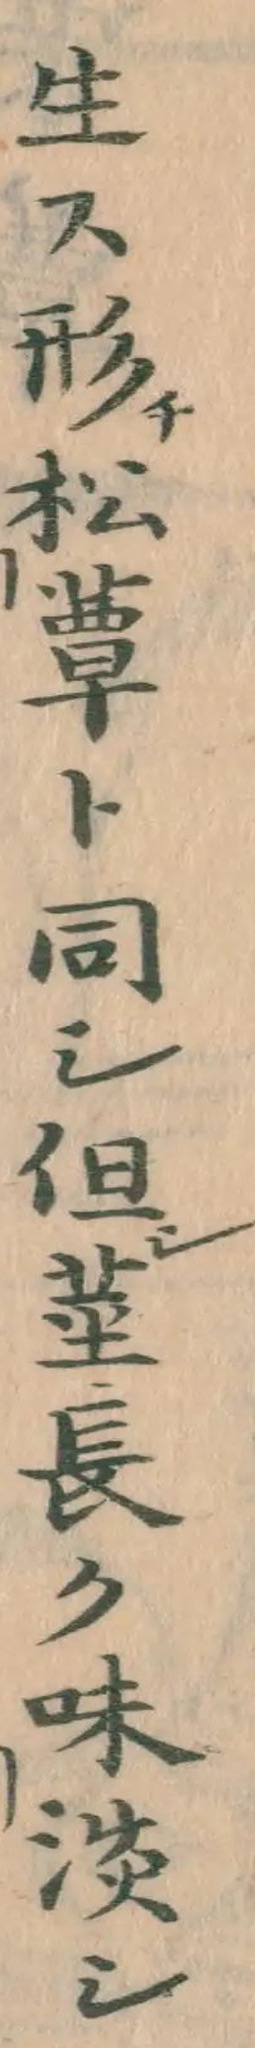生ス形松蕈ト同シ但茎長ク味淡シ
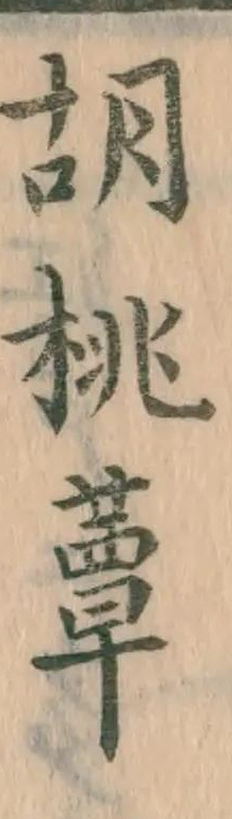胡桃蕈
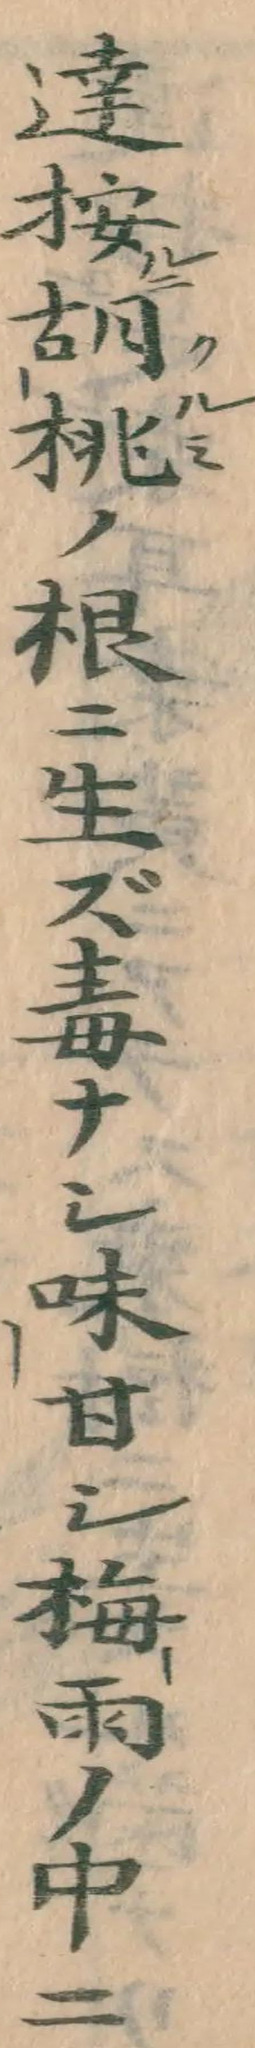達按胡桃ノ根ニ生ズ毒ナシ味甘シ梅雨ノ中ニ
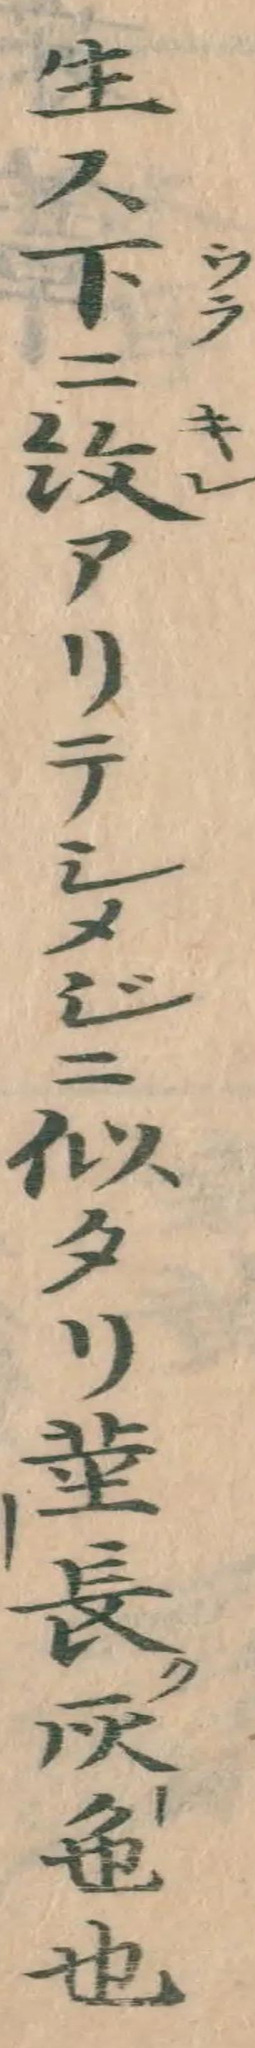生ス下ニ紋アリテシメジニ似タリ茎長灰色也
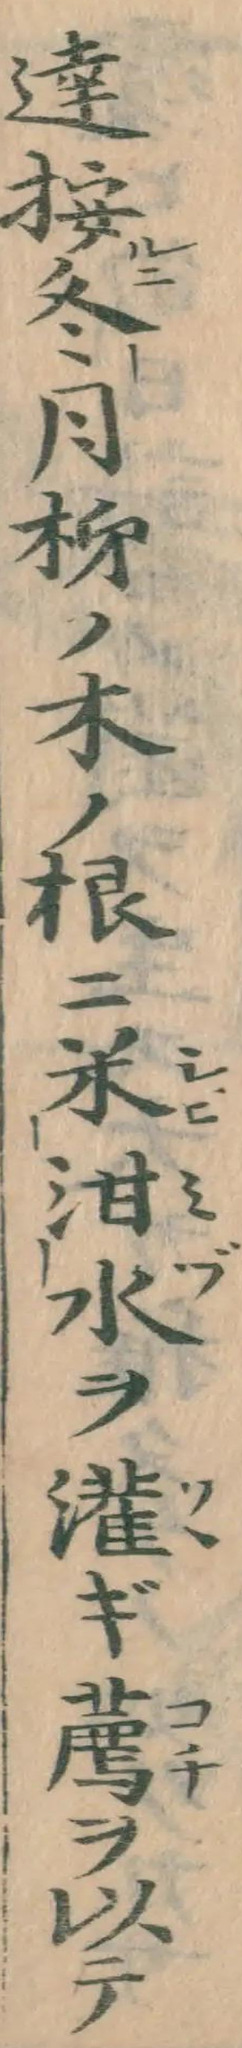達按冬月柳ノ木ノ根ニ米泔水ヲ灌ギ薦ヲ以テ

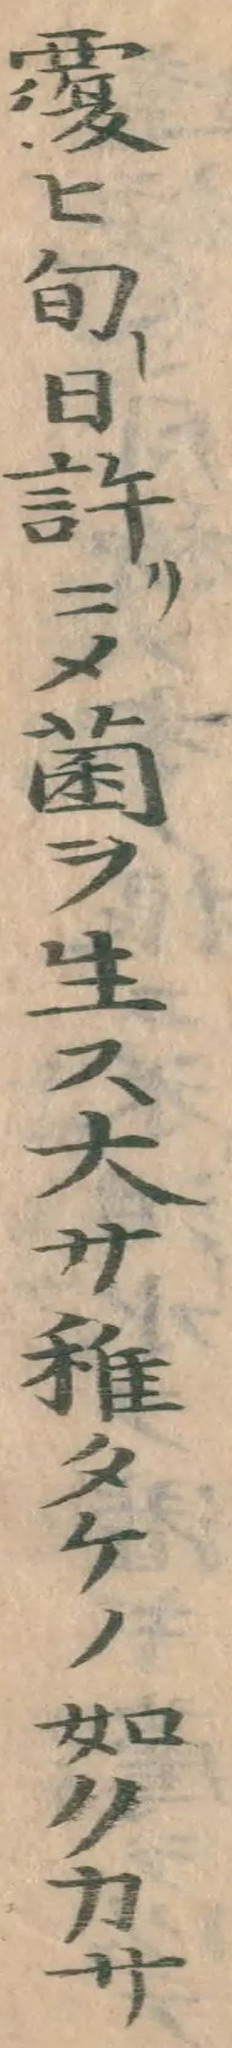覆ヒ旬日許ニシテ菌ヲ生ス大サ椎タケノ如クカサ
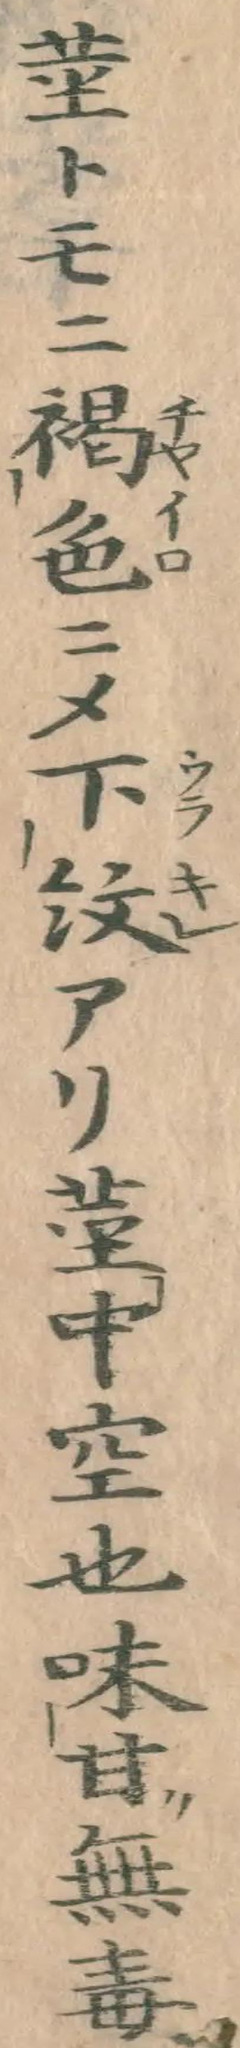茎トモニ褐色ニシテ下紋アリ茎中空也味甘無毒
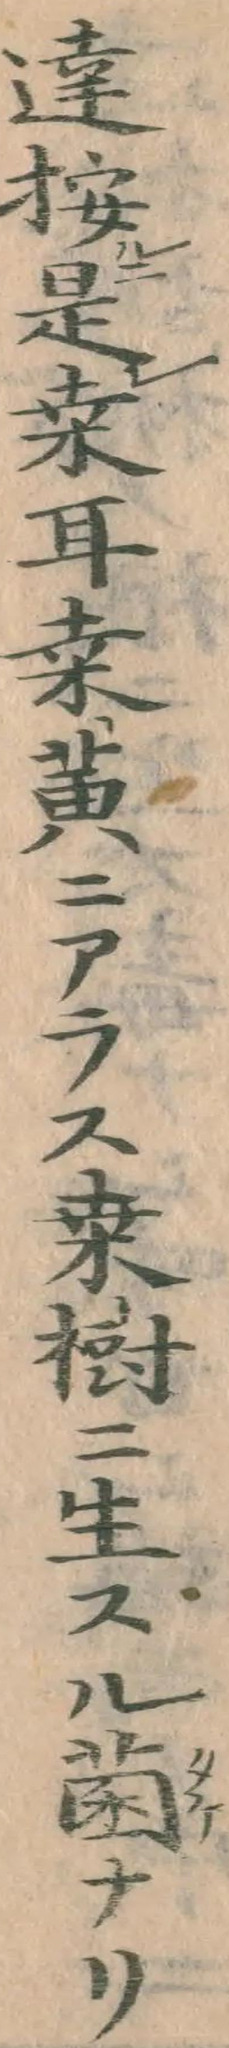達按是桑耳桑黄ニアラス桑樹ニ生スル菌ナリ
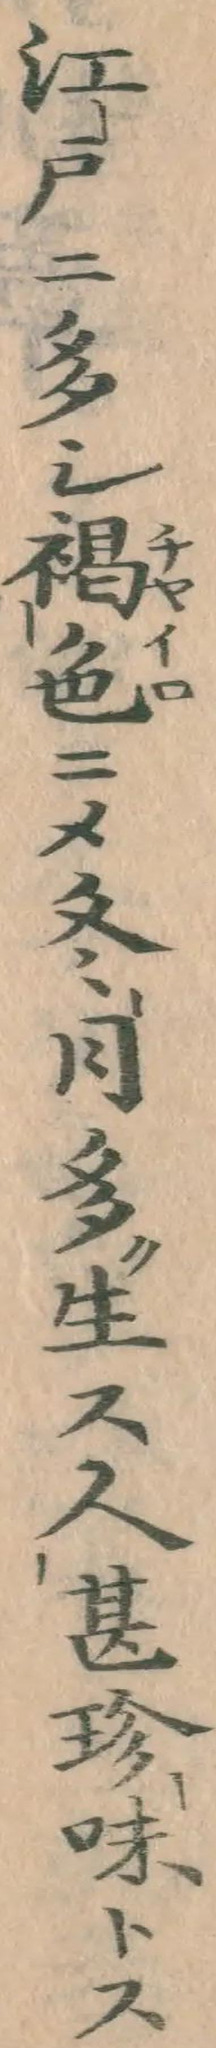江戸ニ多シ褐色ニシテ冬月多生ス人甚珍味トス

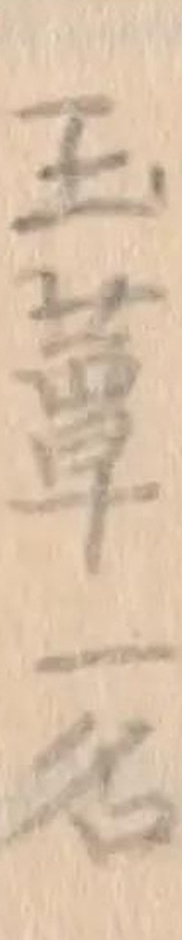玉蕈一名

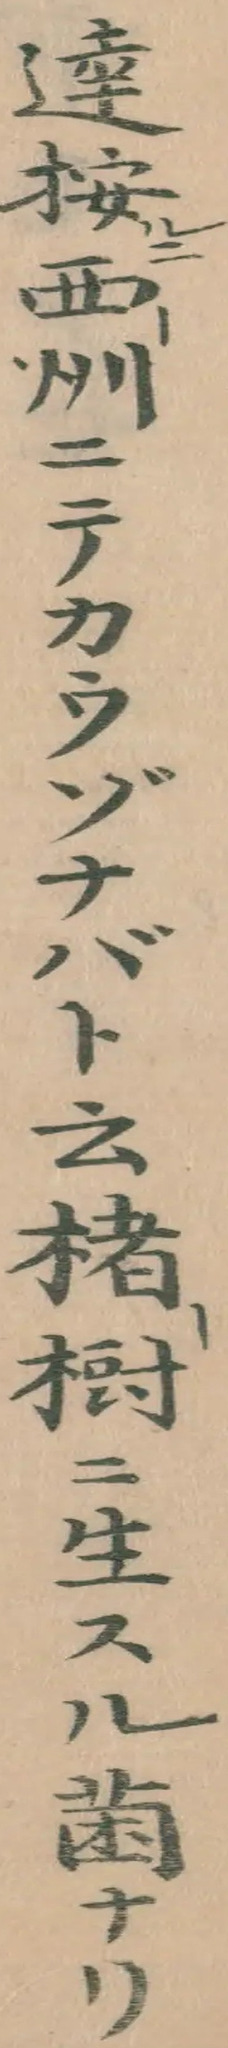達按西州ニテカウゾナバト云楮樹ニ生スル菌ナリ
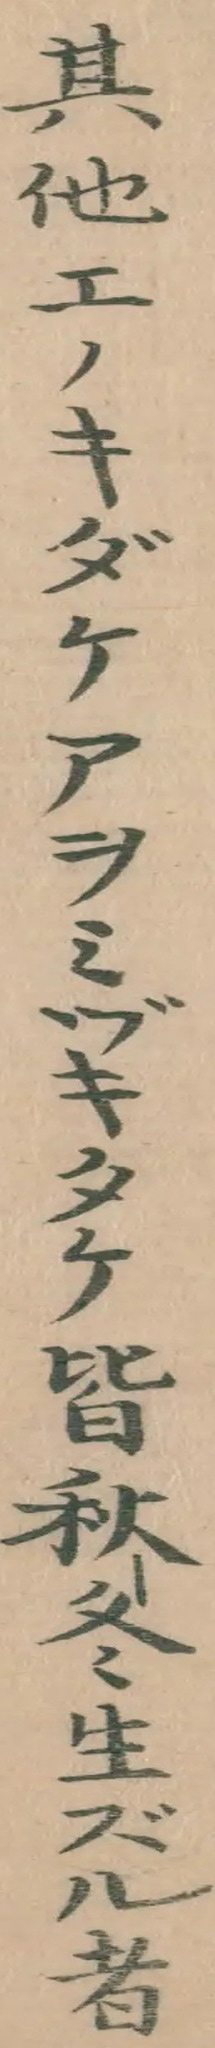其他エノキダケアヲミヅキタケ皆秋冬生ズル者
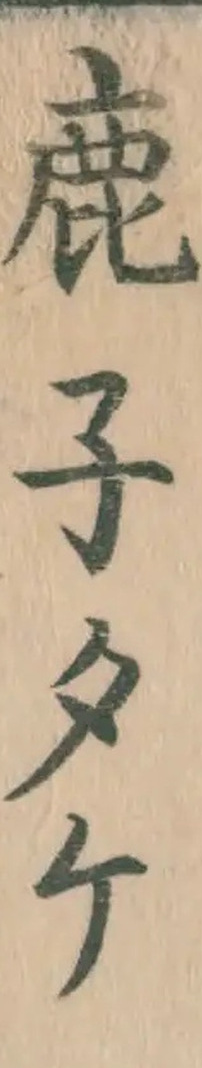鹿子タケ
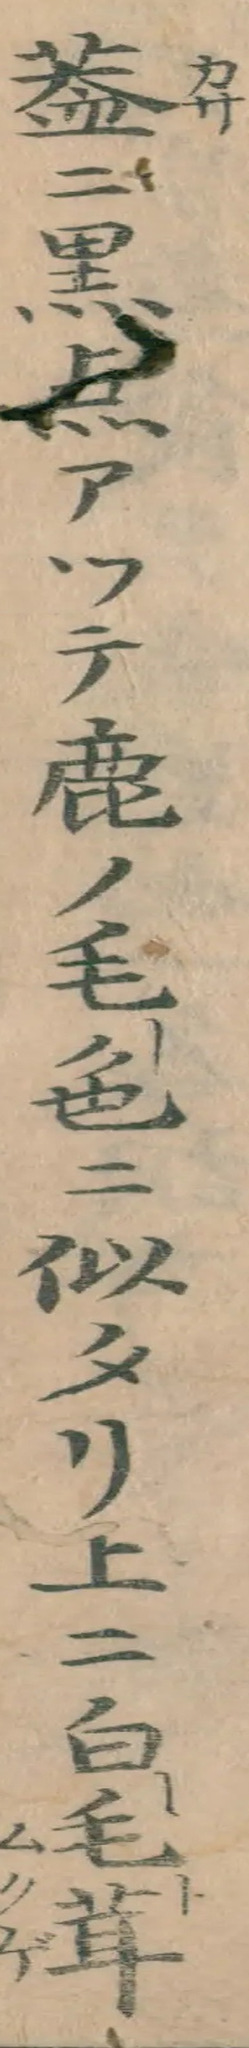葢ニ黒点アツテ鹿ノ毛色ニ似タリ上ニ白毛耳

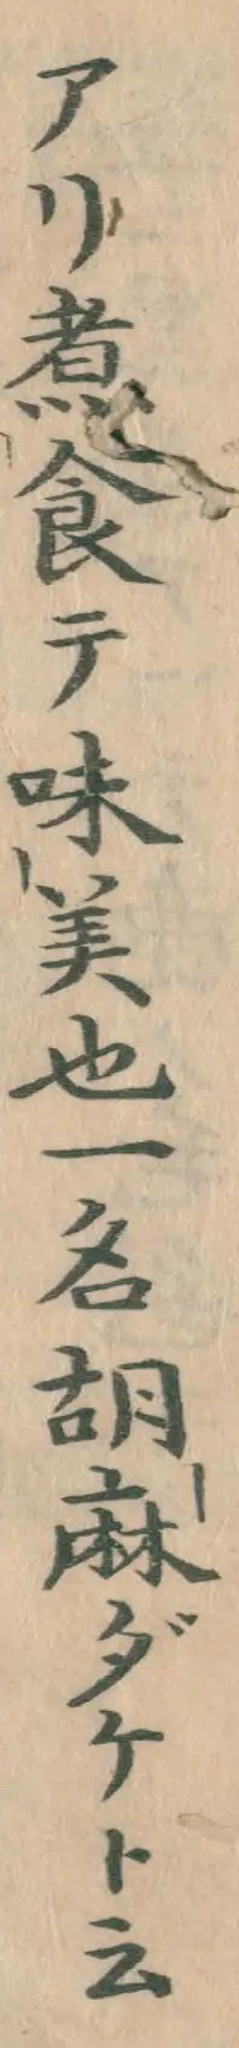アリ煮食テ味美也一名胡麻ダケト云
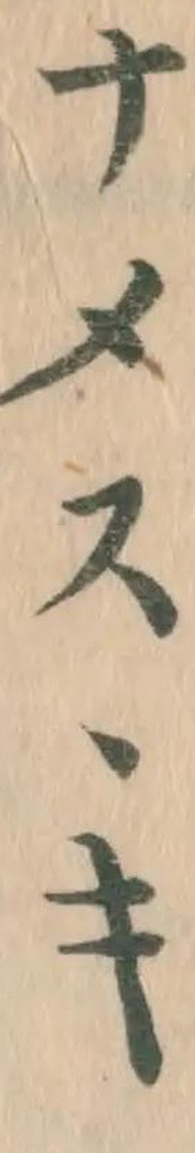ナメスヽキ
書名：怡顔斎菌品 2巻
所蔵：国立国会図書館 National Diet Library, JAPAN
